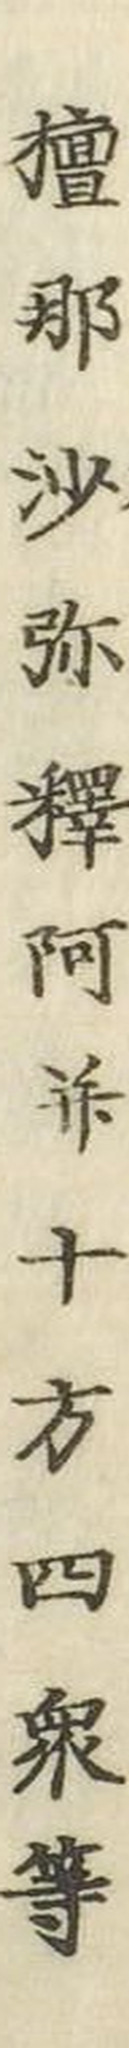檀那沙弥釋阿幷十方四衆等
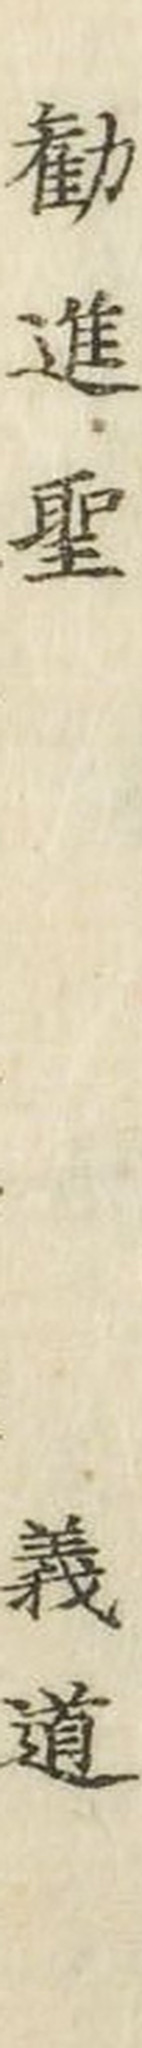勧進聖義道
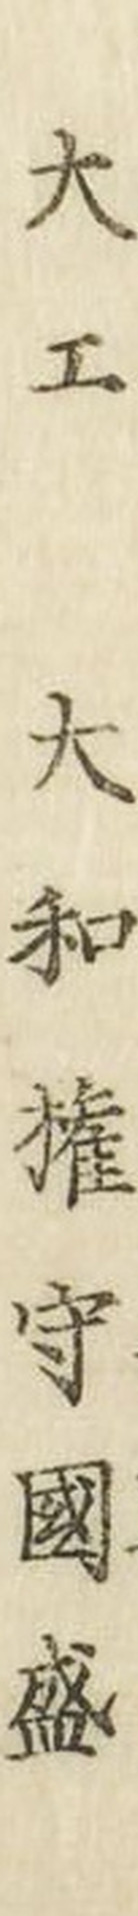大工大和権守國盛
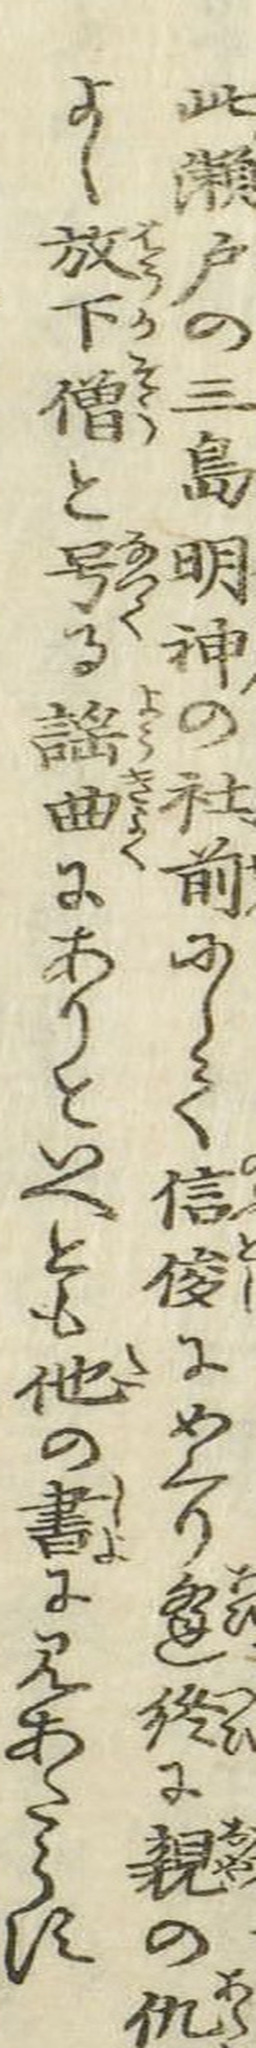よし放下僧と号る謡曲にありといへとも他の書に見あたらす
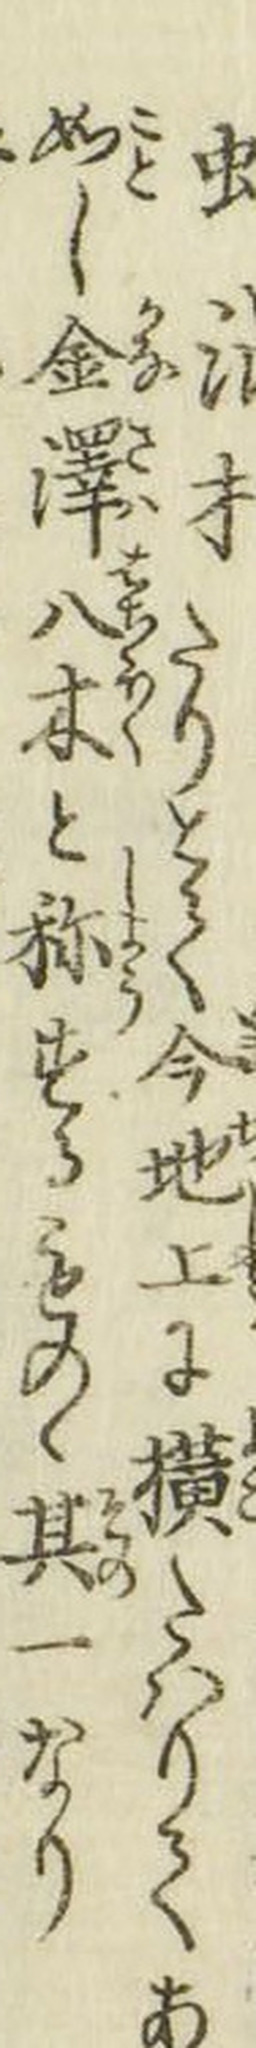如し金澤八木と称するものゝ其一なり
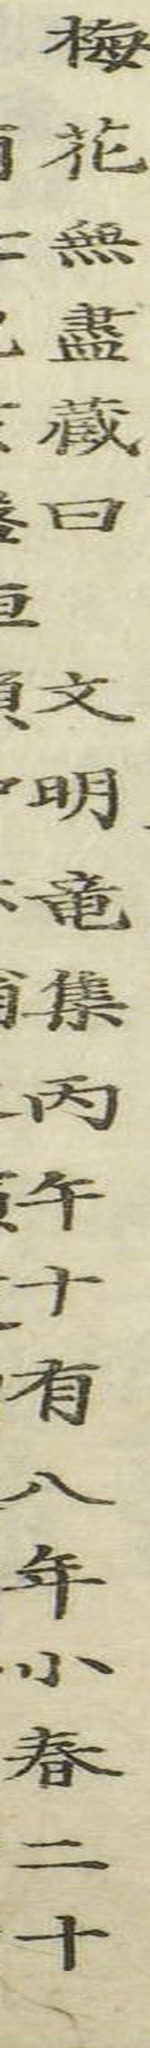梅花無盡蔵曰文明竜集丙午十有八年小春二十
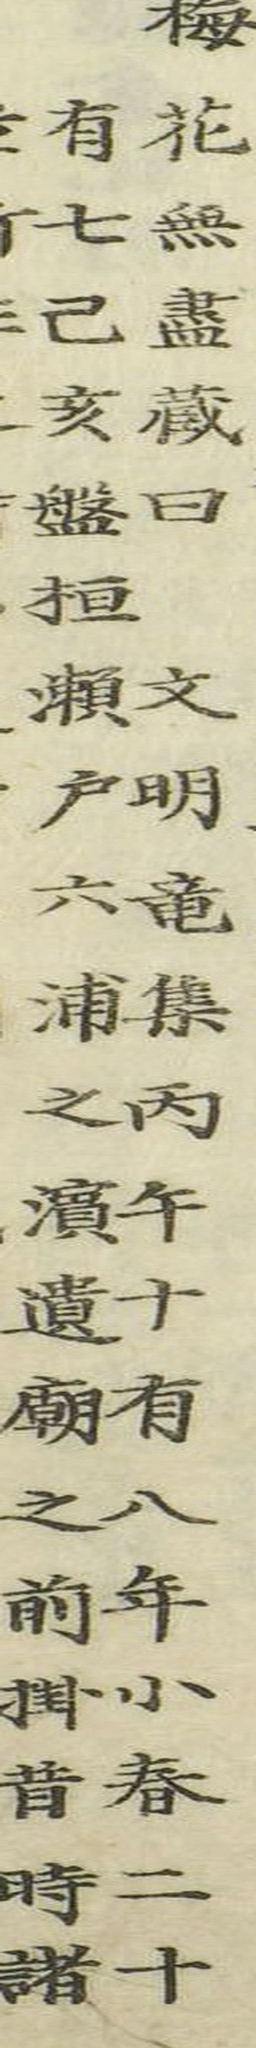有七己亥盤桓瀬戸六浦之濵遺廟之前掛昔時諸
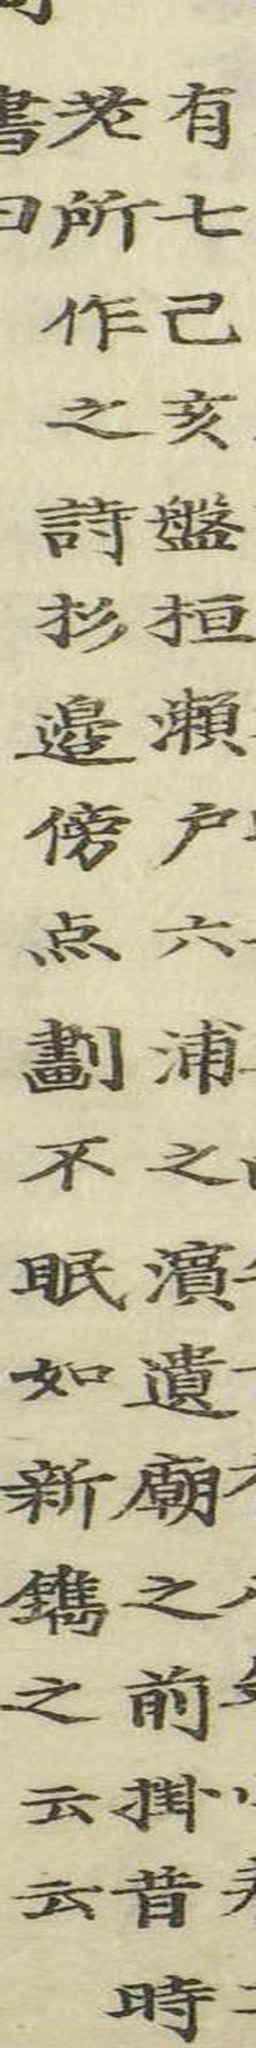老所作之詩杉邉傍点劃不眠如新鐫之云云
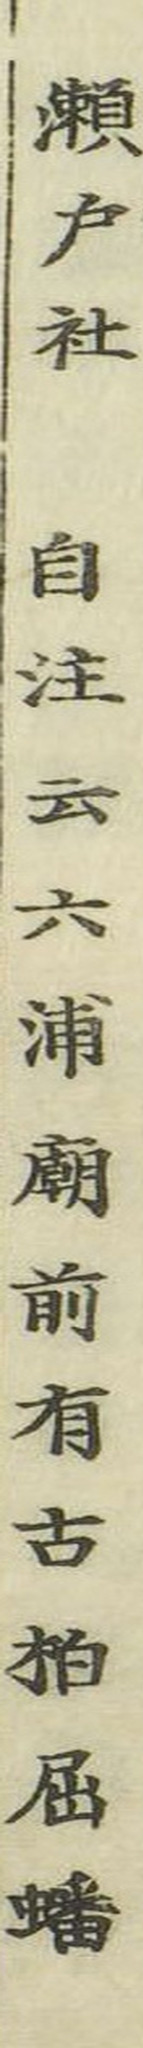瀬戸社自注云六浦廟前有古柏屈蟠

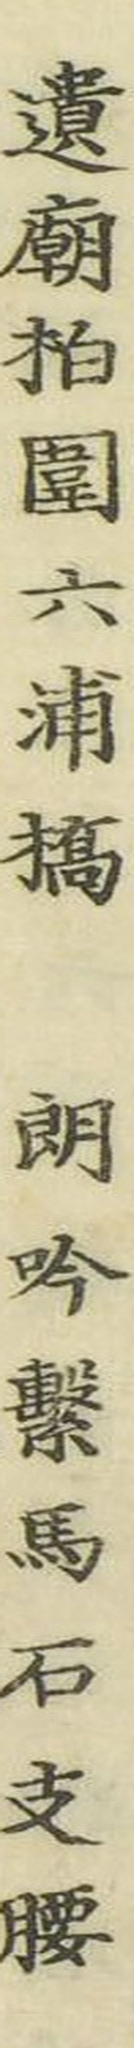遺廟柏圍六浦橋朗吟繫馬石支腰
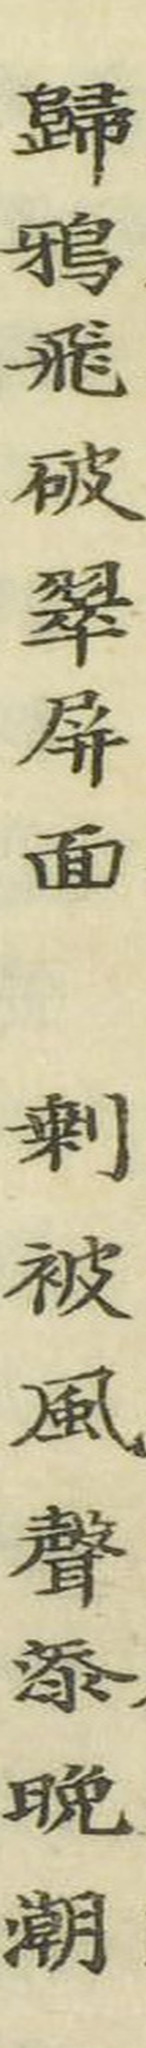歸鴉飛破翠屏面剰被風聲添晩潮
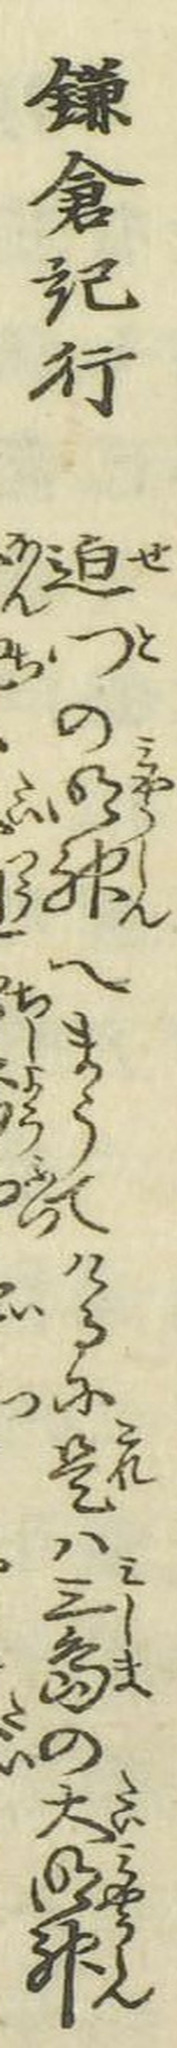鎌倉記行迫門の明神へまうてけるに是は三島の大明神
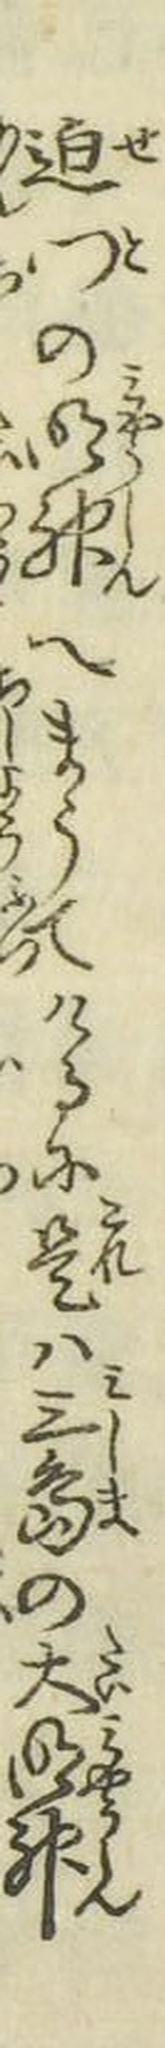鎌倉記行迫門の明神へまうてけるに是は三島の大明神
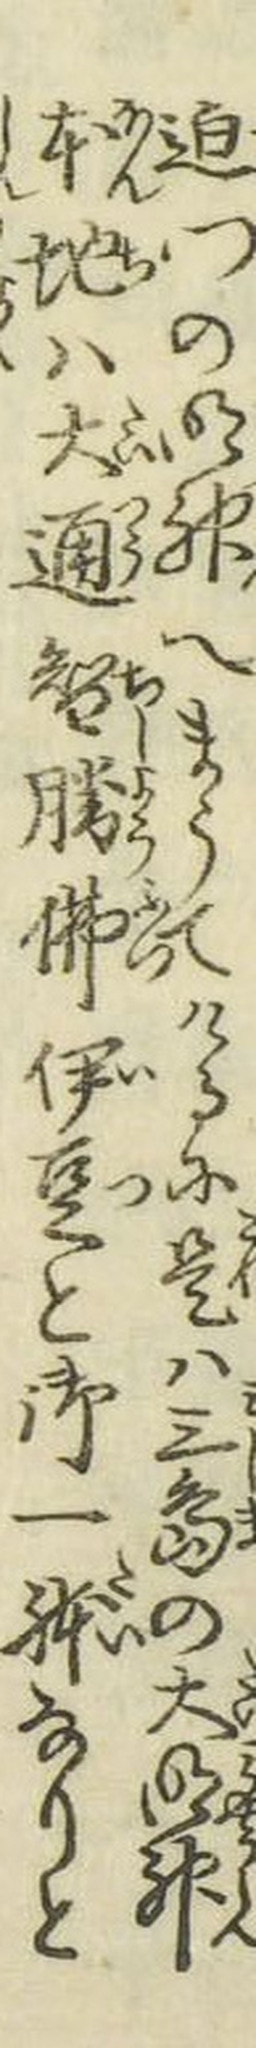本地は大通智勝佛伊豆と御一躰なりと
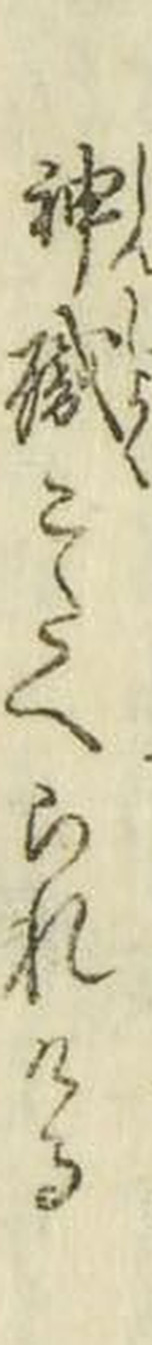神職こたへられける
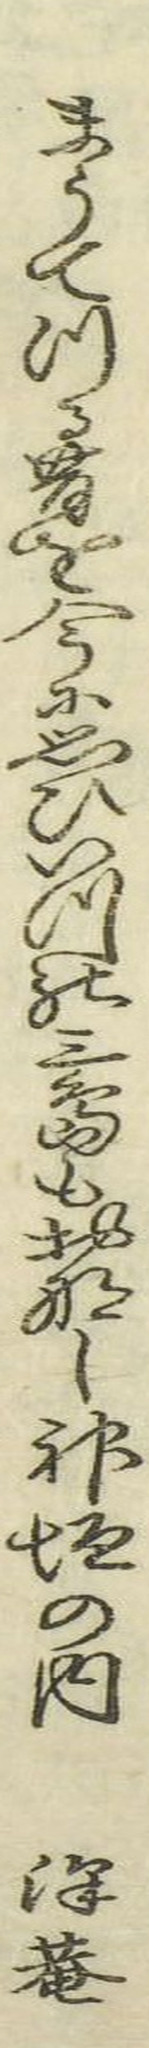まうてつる昔を今に思ひいつの三島もおなし神垣の内澤菴
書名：江戸名所図会 20巻 巻之6
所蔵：東京学芸大学教育コンテンツアーカイブ
